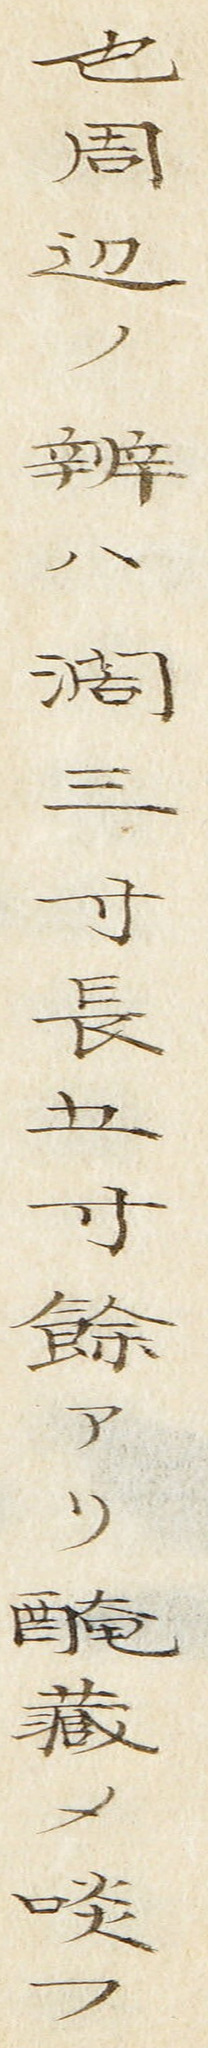也周辺ノ弁ハ濶三寸長五寸余アリ醃蔵シテ啖フ

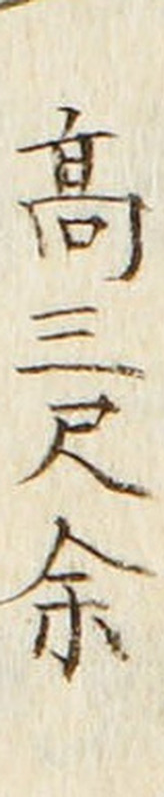高三尺余
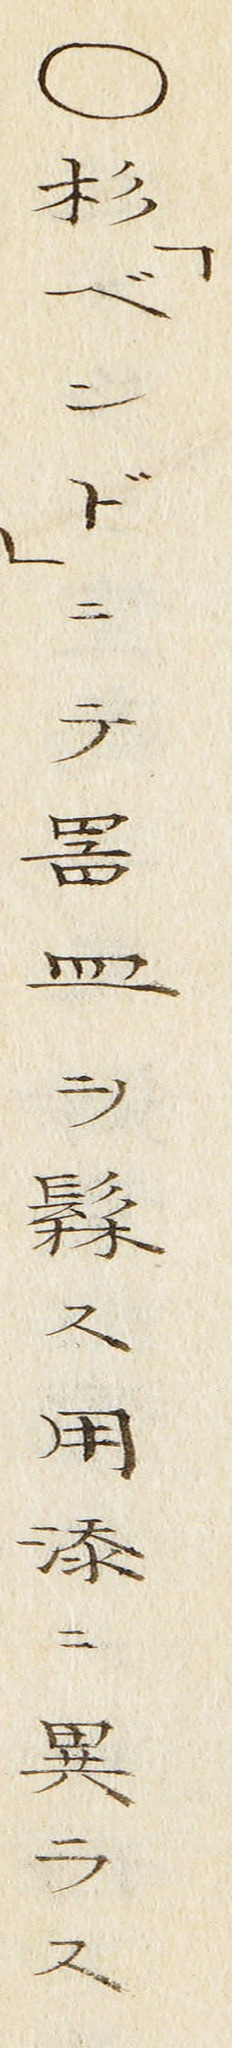〇杉「ベンド」ニテ器皿ヲ鬆？ス用漆ニ異ラス
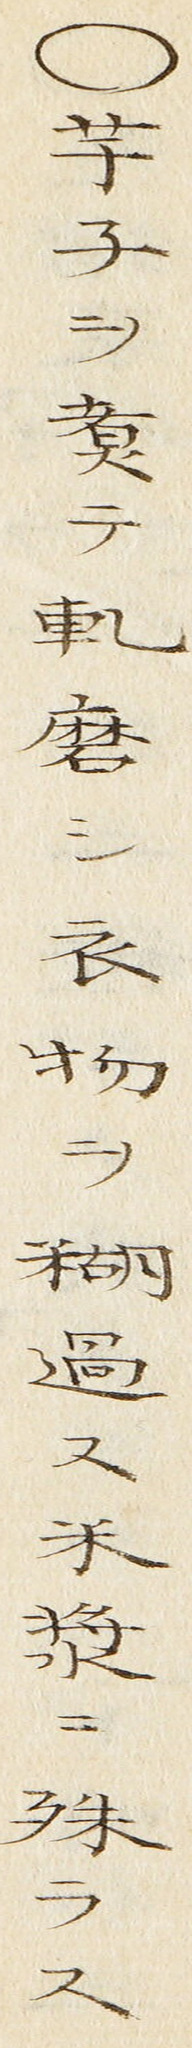〇芋子ヲ煮テ軋磨シ衣物ヲ糊過ス米漿ニ殊ラス
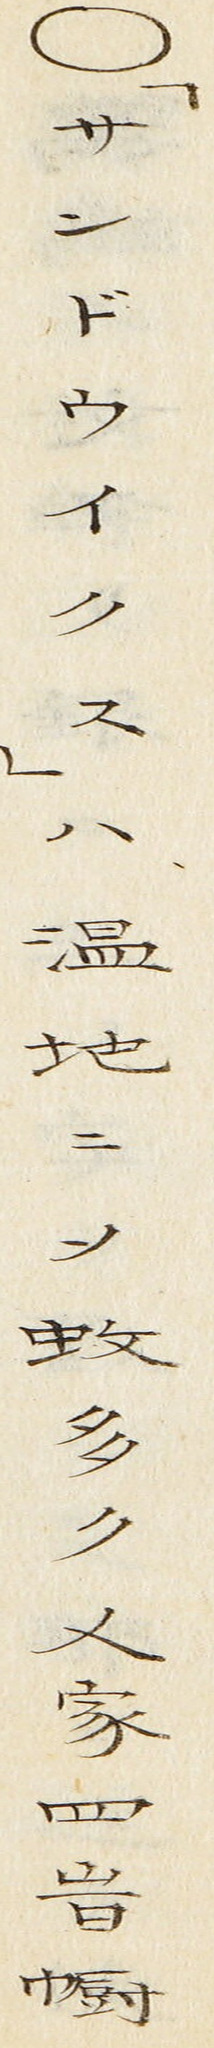〇「サンドウイクス」ハ温地ニシテ蚊多ク人家四旹幮
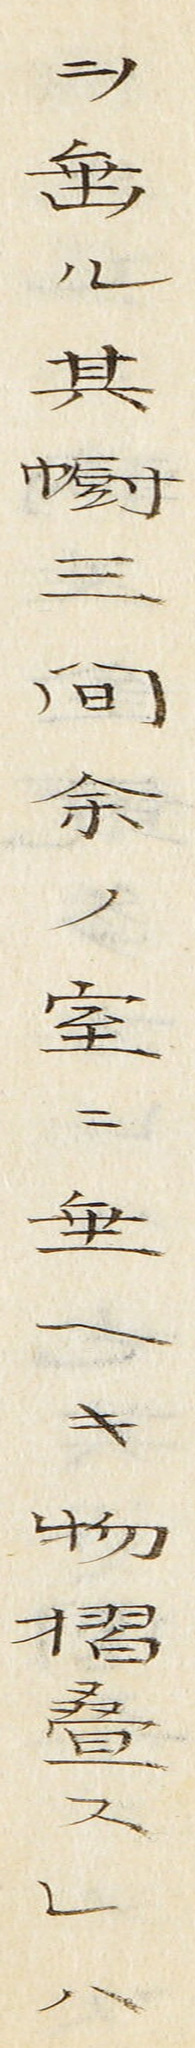ヲ垂ル其幮三間余ノ室ニ垂ヘキ物摺叠スレハ
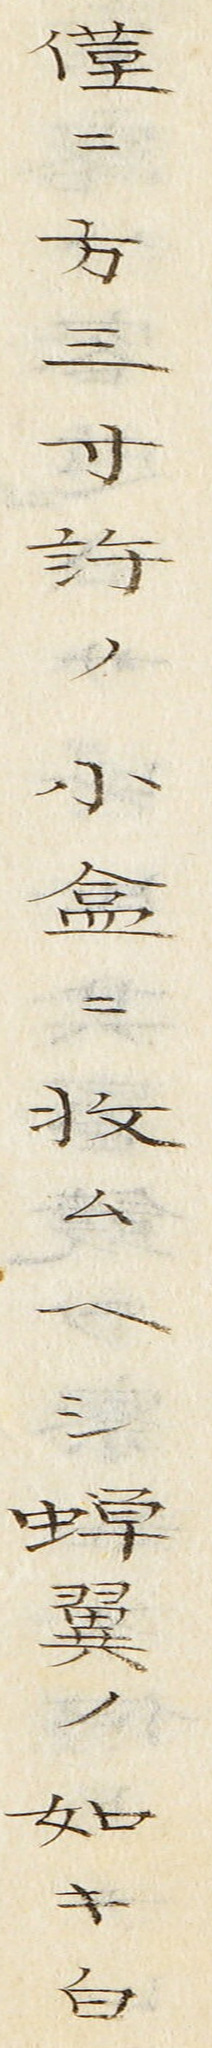僅ニ方三寸許ノ小盒ニ収ムヘシ蝉翼ノ如キ白
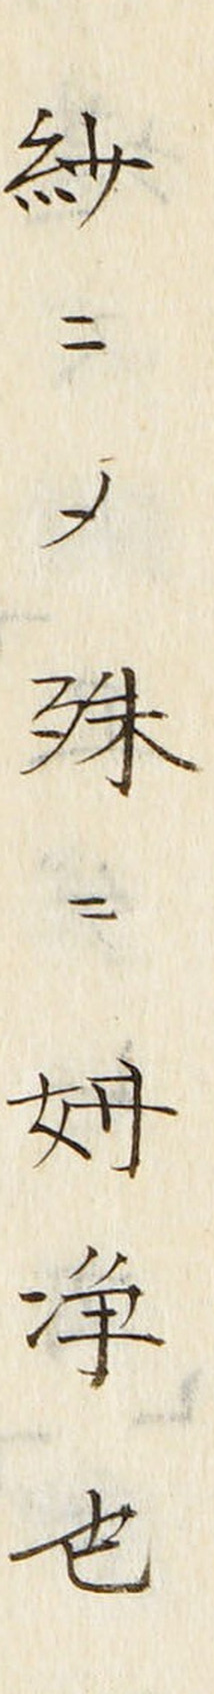紗ニシテ殊ニ妍浄也
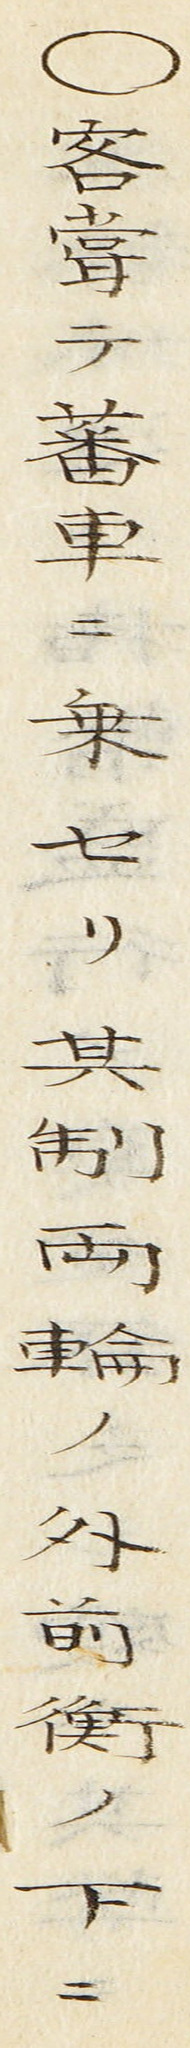〇客嘗テ蕃車ニ乗セリ其制両輪ノ外前衡ノ下ニ
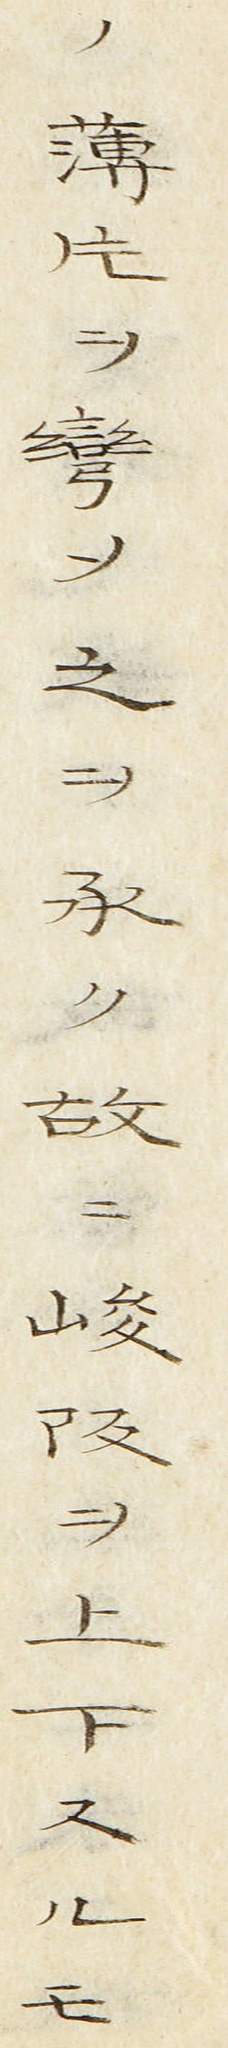ノ薄片ヲ彎シテ之ヲ承ク故ニ峻阪ヲ上下スルモ
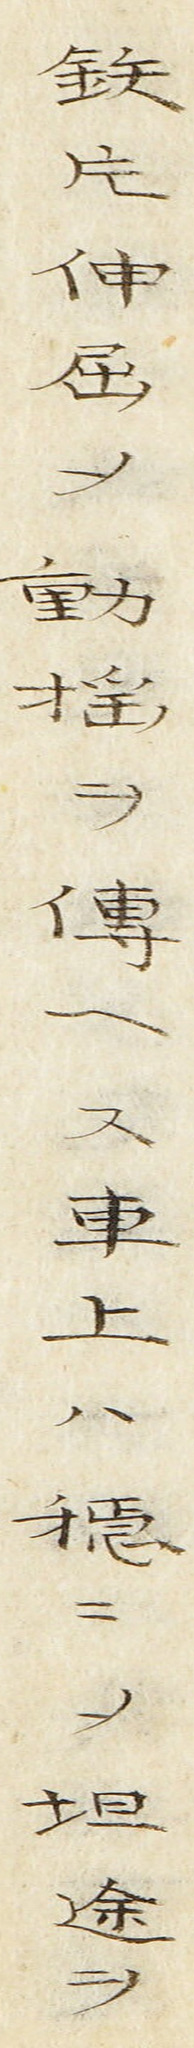鉄片伸屈シテ動揺ヲ伝ヘス車上ハ穏ニシテ坦途ヲ
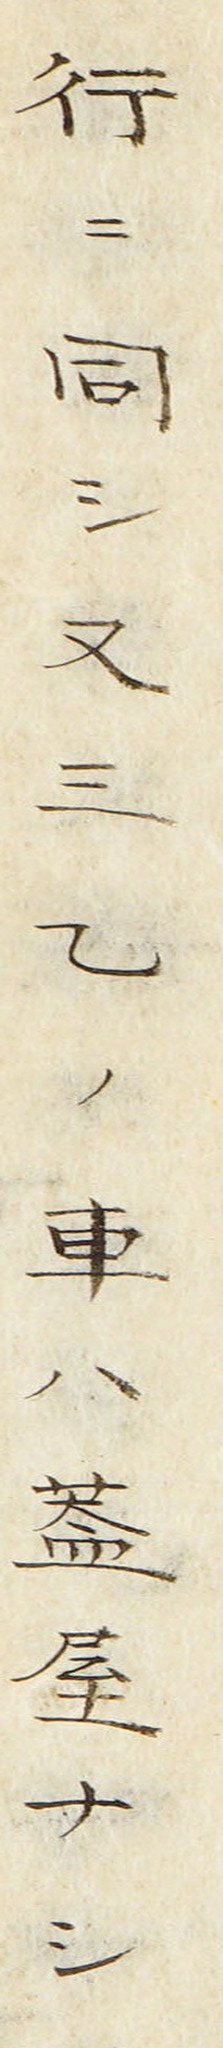行ニ同シ又三乙ノ車ハ蓋屋ナシ

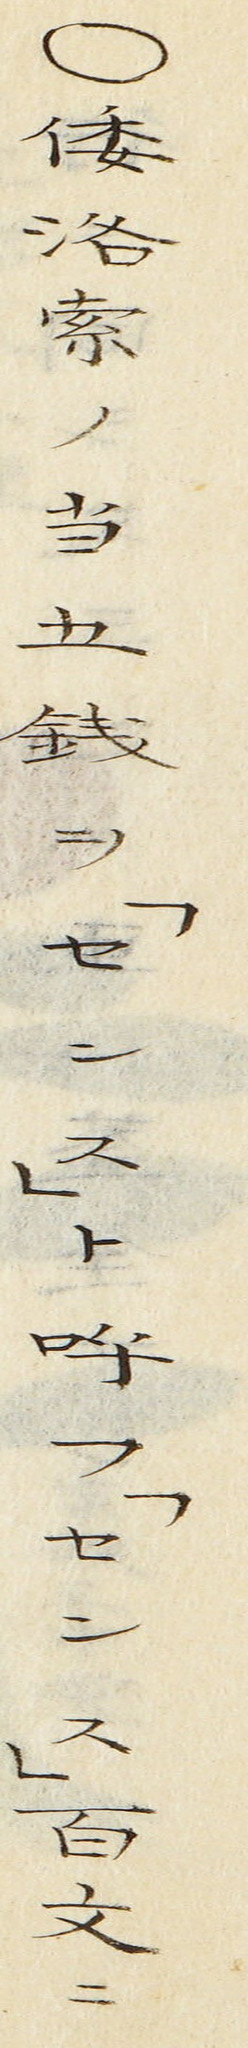〇倭洛索ノ当五銭ヲ「センス」ト呼フ「センス」百文ニ
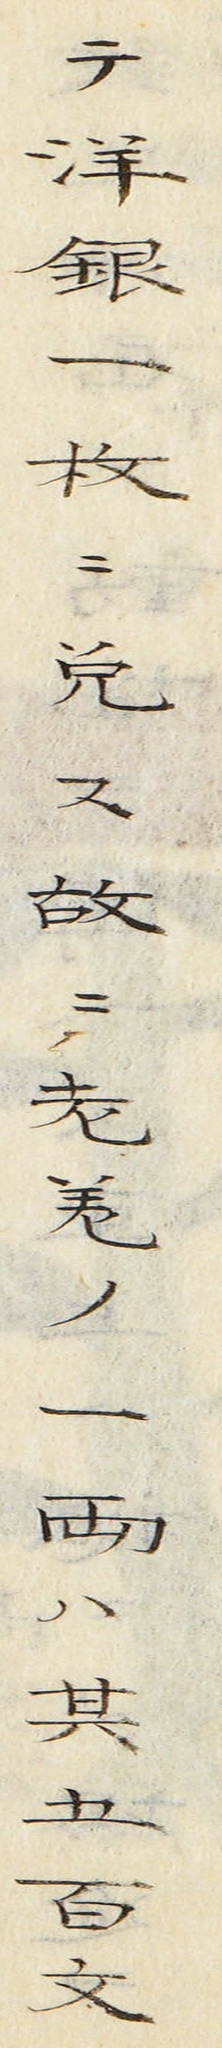テ洋銀一枚ニ兌ス故ニ老羗ノ一両ハ其五百文
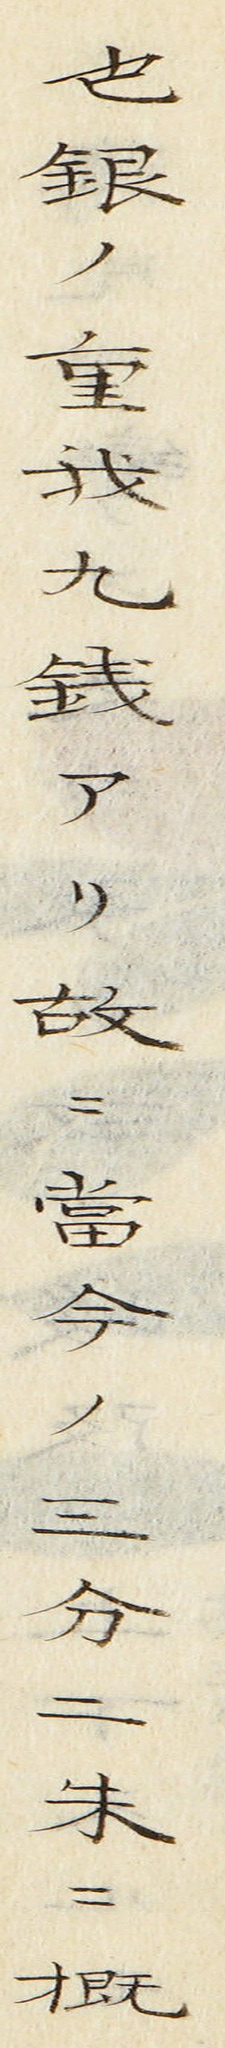也銀ノ重我九銭アリ故ニ当今ノ三分二朱ニ概
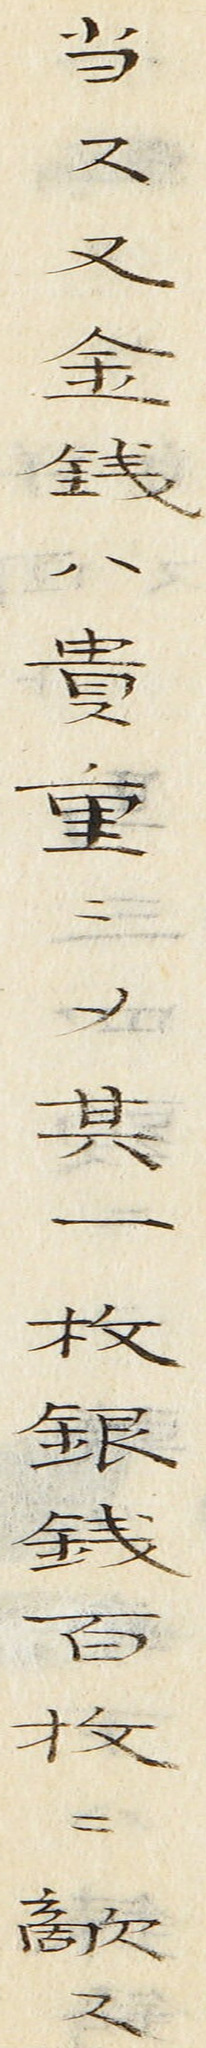当ス又金銭ハ貴重ニシテ其一枚銀銭百枚敵ス
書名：蕃談
